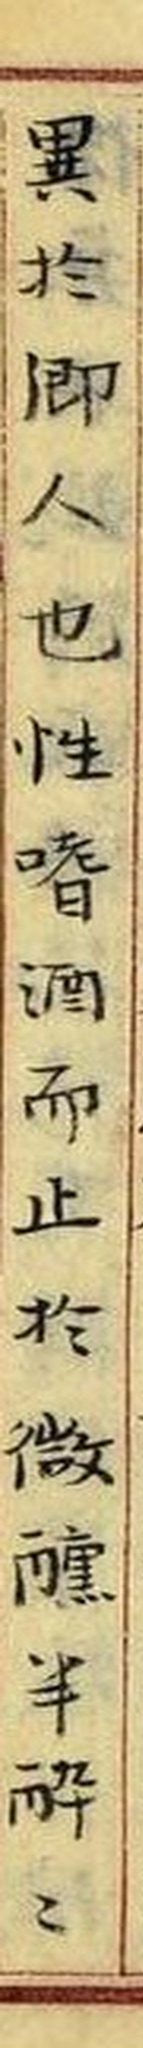異於郷人也性嗜酒而止於微醺半酔々

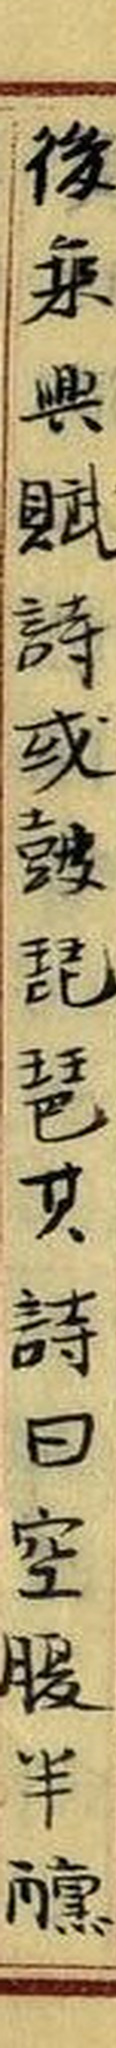後乘興賦詩或皷琵琶其詩曰空腹半醺
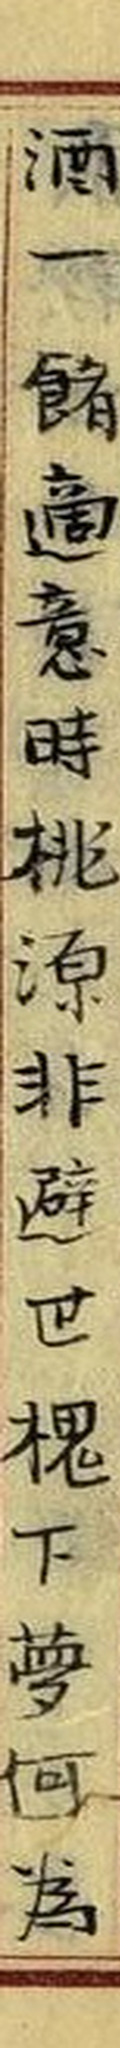酒一餚適意時桃源非避世槐下夢何為
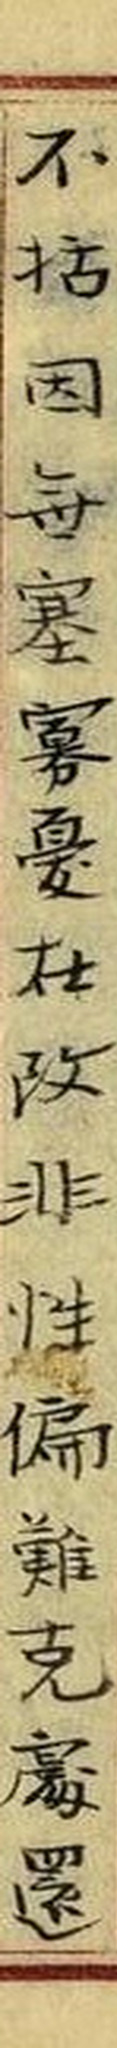不括因無塞寡憂在𨸩非性偏難克䖏還
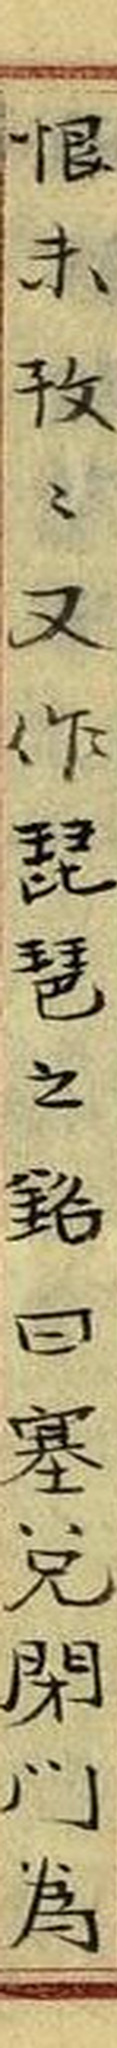恨未孜々又作琵琶之銘曰塞兌閉門為
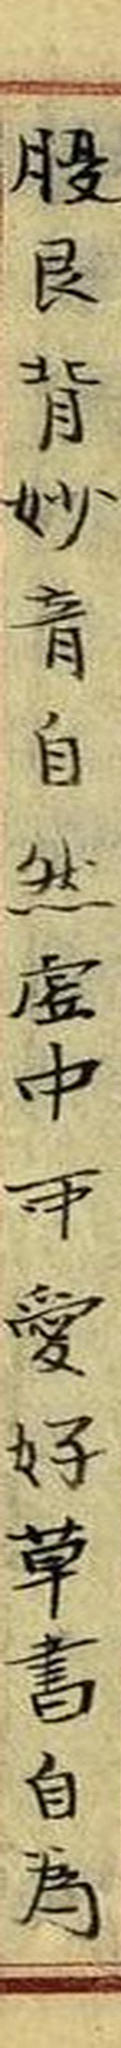腹艮背妙音自然虗中𠂝愛好草書自為
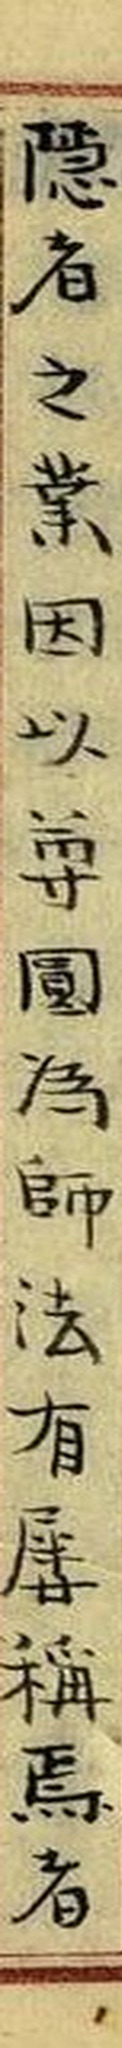隠者之業因以尊圓為師法有屡稱焉者
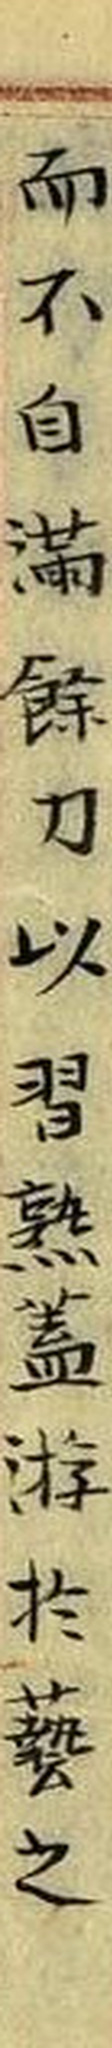而不自滿餘力以習熟蓋游於藝之
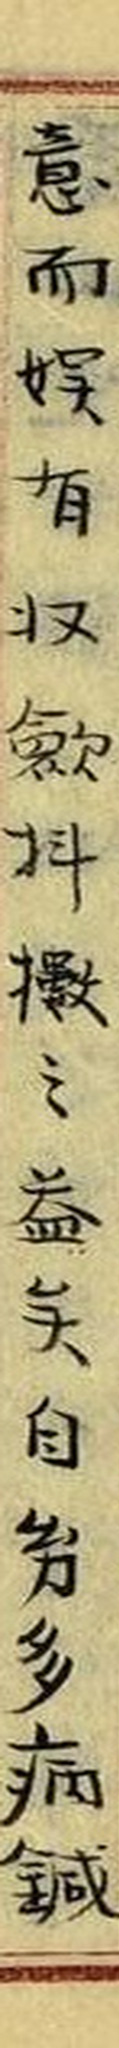意而娱有収歛抖擻之益矣自𢆲多病鍼
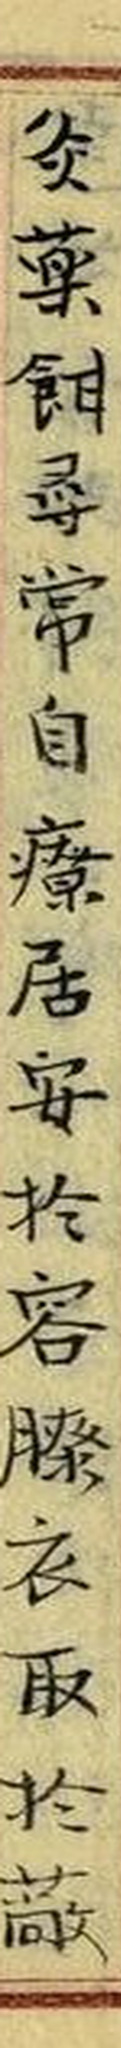灸薬餌尋常自療居安於容膝衣取於蔽
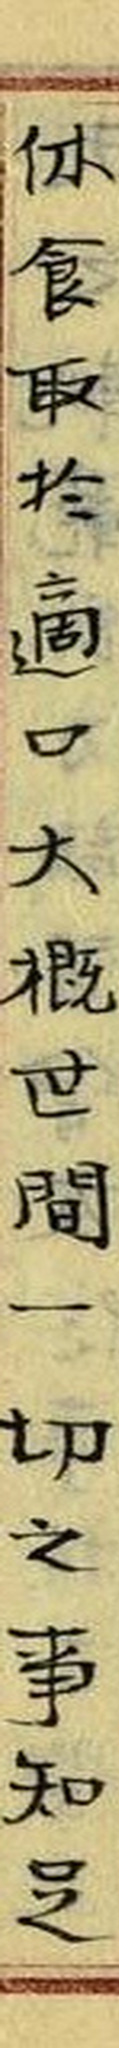休食取於適口大概世間一切之事知𠯁
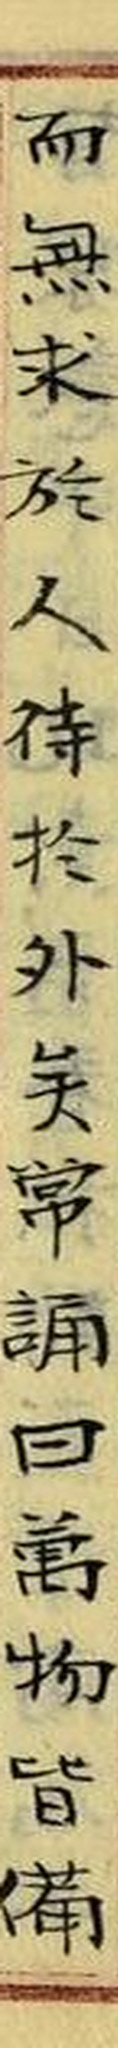而無求於人待於外矣常誦曰萬物皆備
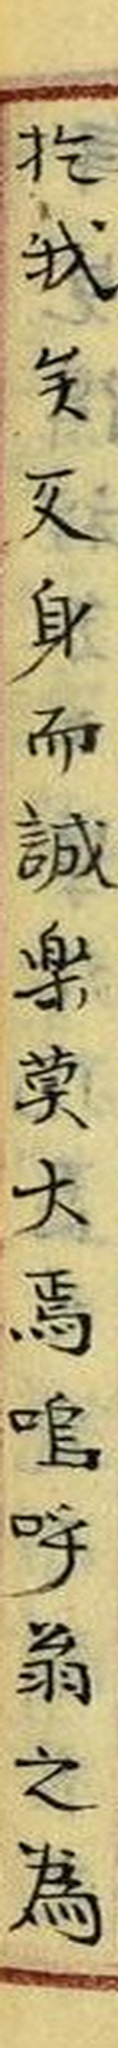於我矣又身而誠楽莫大焉嗚呼翁之為
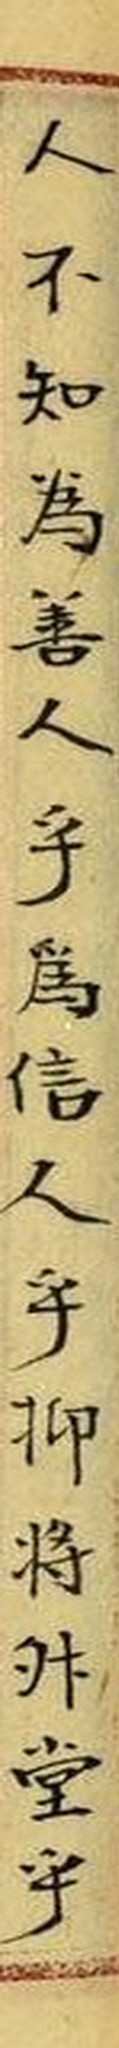人不知為善人乎爲信人乎抑將外堂乎
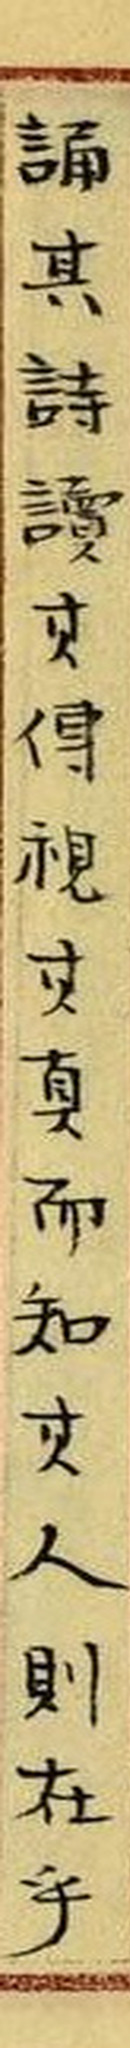誦其詩讀其傳視其真而知其人則在乎
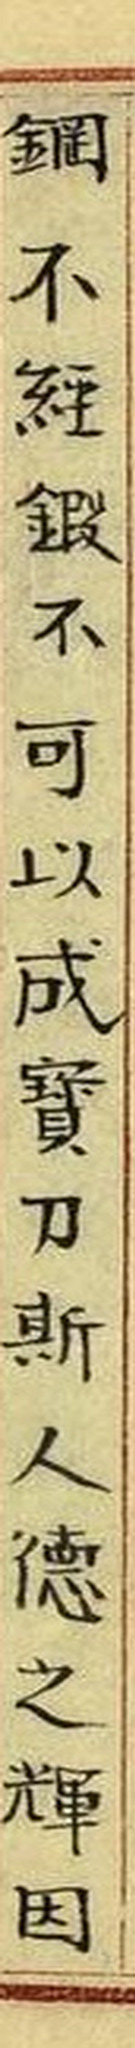鋼不經鍛不可以成寳刀斯人德之輝因
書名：温古集 四巻
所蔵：福井県文書館 Fukui Prefectural Archives
